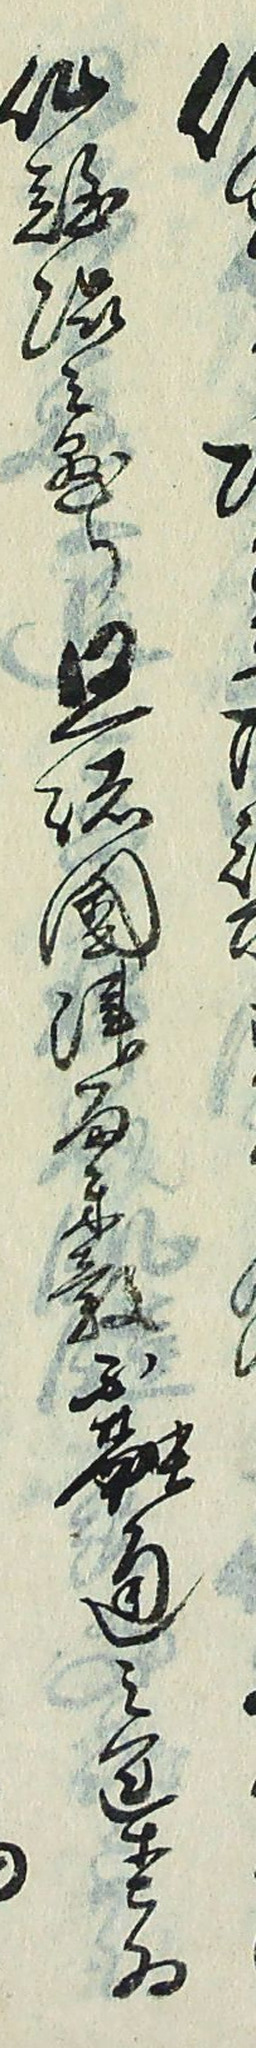作難渋之懸り且諸国津留米穀不融通之運等被為
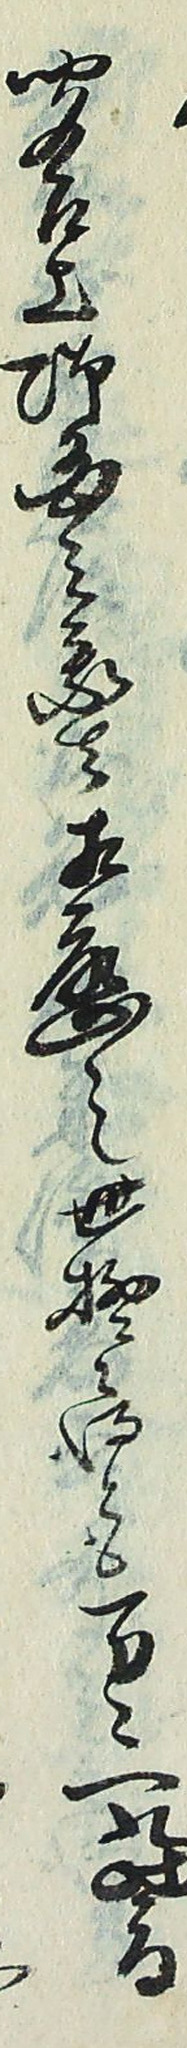聞召上御国之義者相應之世柄ニ候得とも万々一當夏
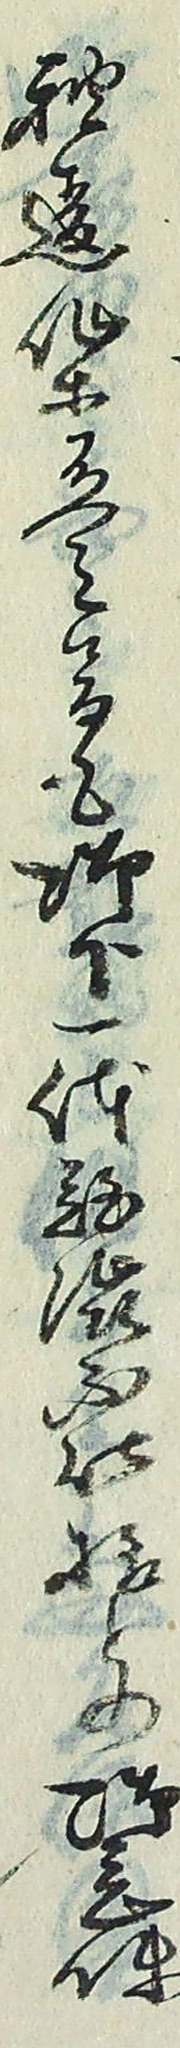秋違作等有之候而も御下一体難難渋不仕様との御意味
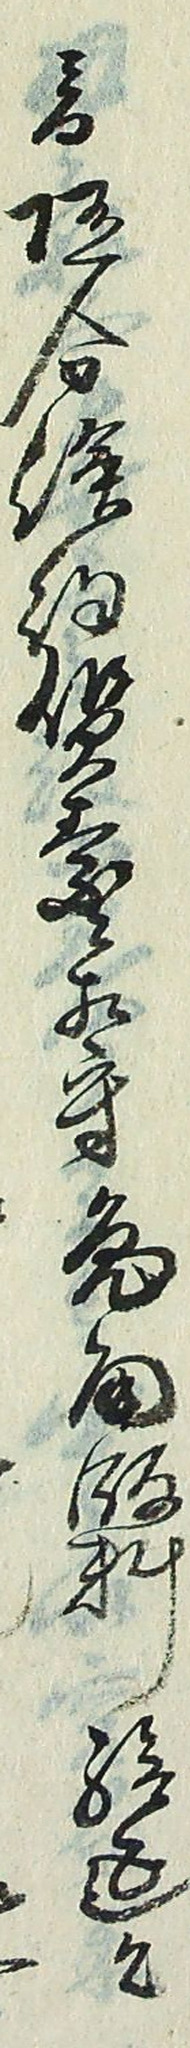ニ而随分倹約質素ニ相守兎角飯料給延候
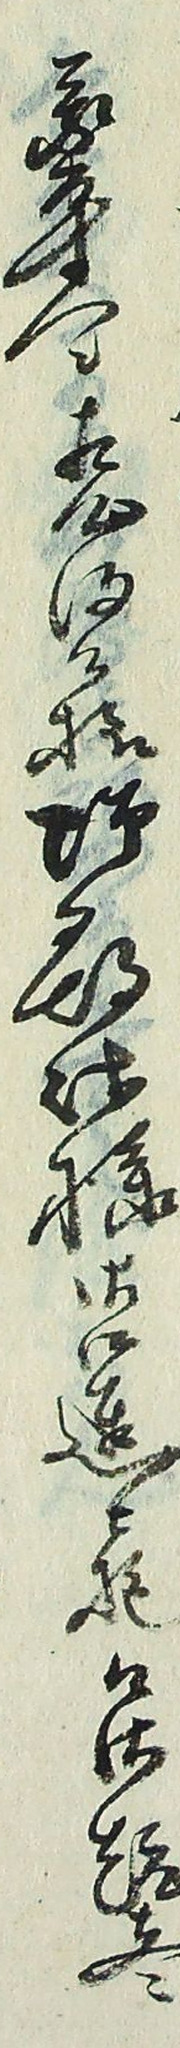義専一ニ相心得候様御郡代様御口達被遊候御趣夫々
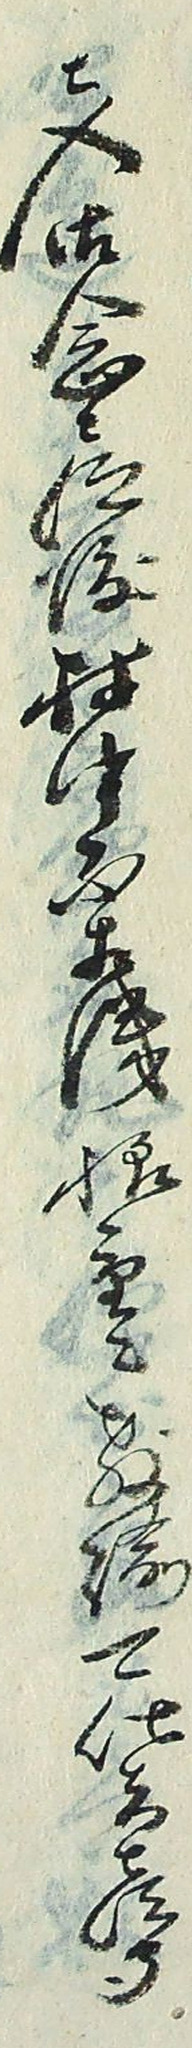被入御念被仰渡村中不相洩様重々教諭可仕旨被仰聞
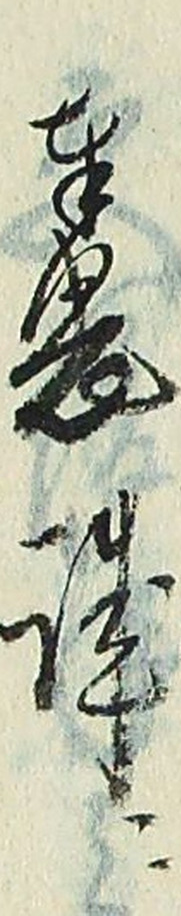奉畏誠ニ
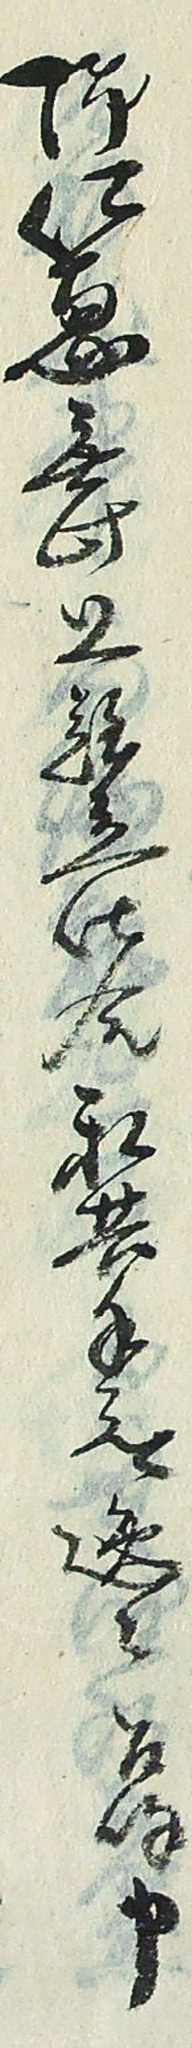御仁恵無此上難有仕合私共手元へ逸々召呼申
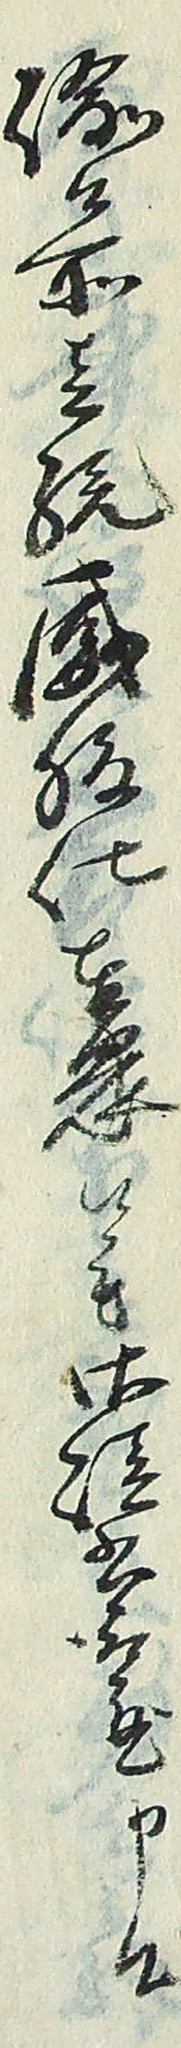諭候所壱統感服仕奉畏候ニ付御請書取懸申候

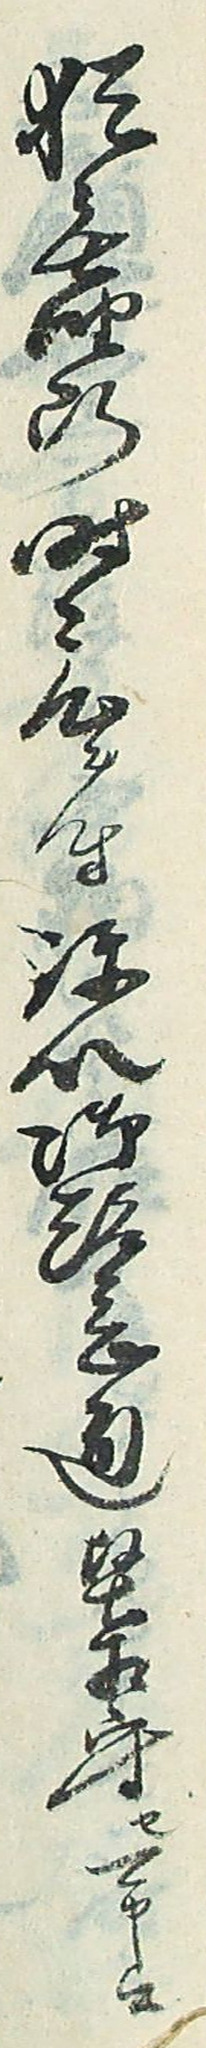猶無油断時々心ヲ付弥以御趣意通堅相守セ可申候
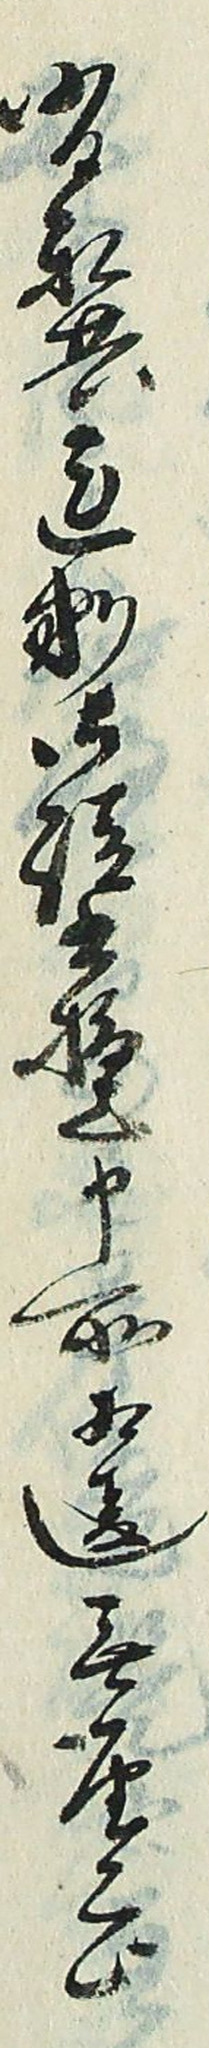仍而私共連判御請書指出申所相違無御坐候以上
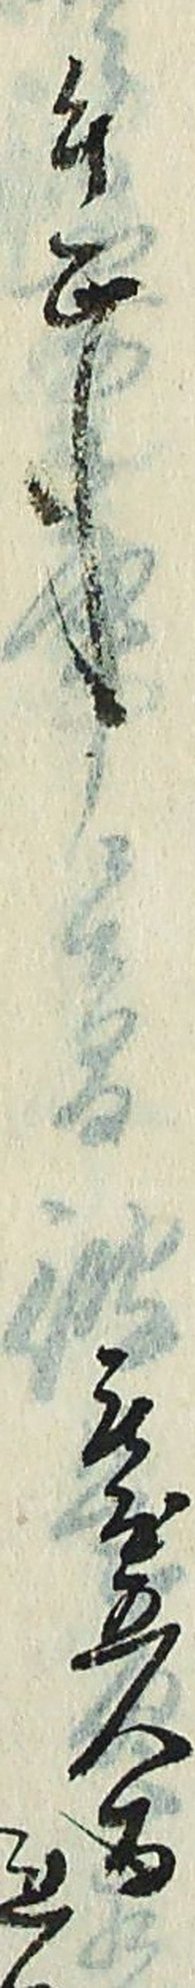午正月庄屋五人与
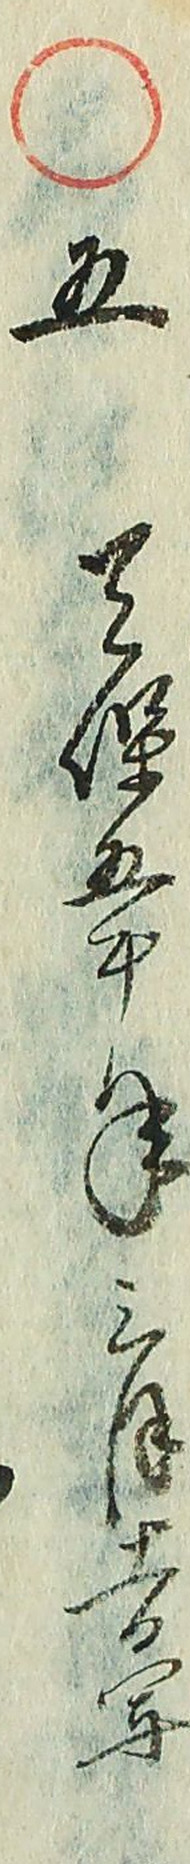天保五午年三月十一日写
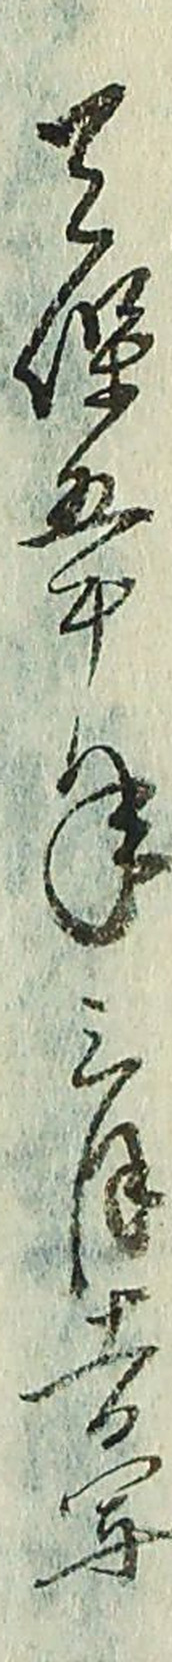天保五午年三月十一日写
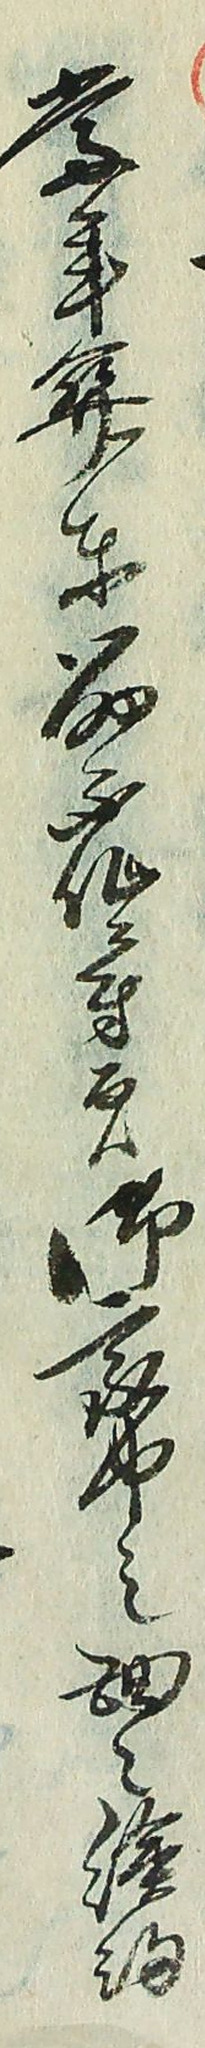當年関東筋不作ニ付而ハ御家中之面々倹約
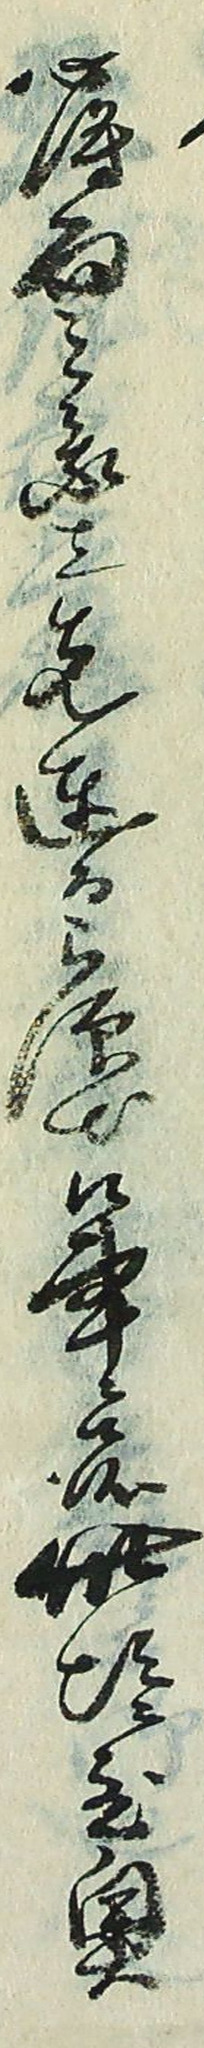心得向之義者先達而被仰出候事ニ候所此頃ニ至奥
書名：諸御趣意書并御下知向之写
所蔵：鳴門教育大学 Naruto University of Education
